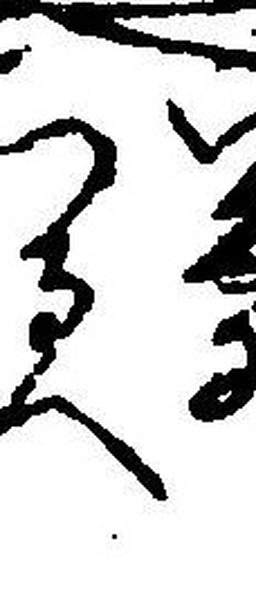つるへ
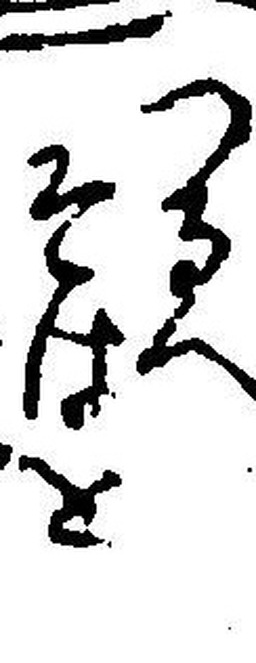そはを
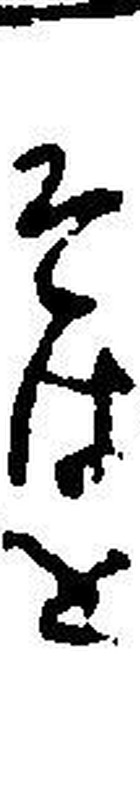そはを
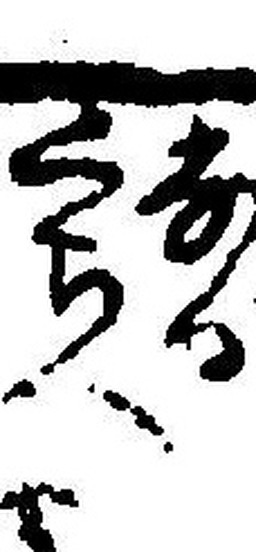くちへ
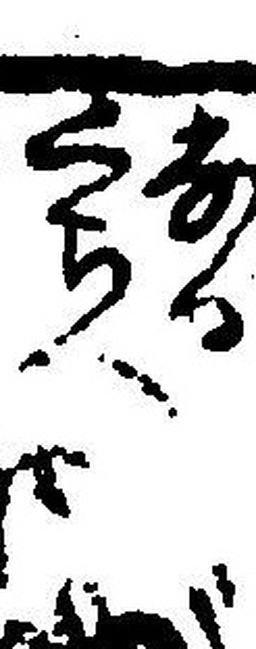くちへ
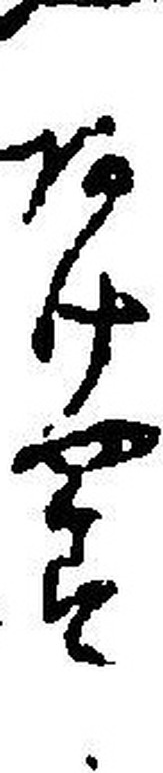あけやす
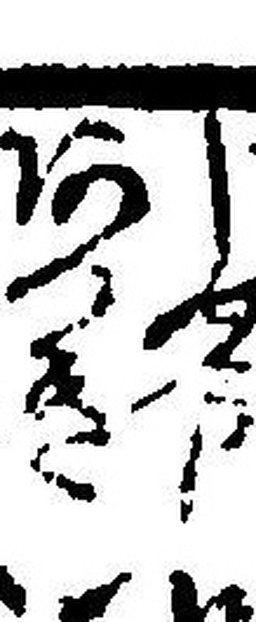あつき
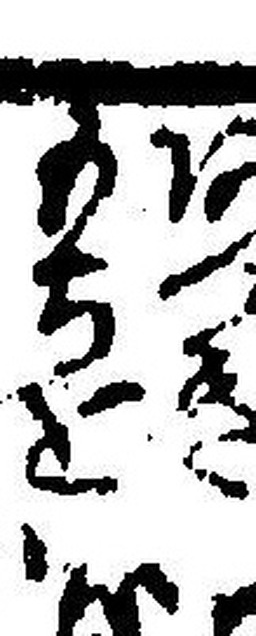もちを
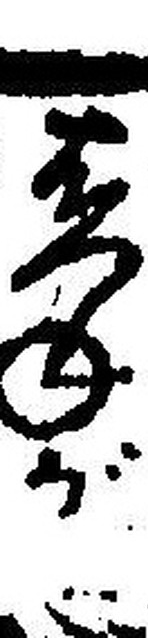はつねが
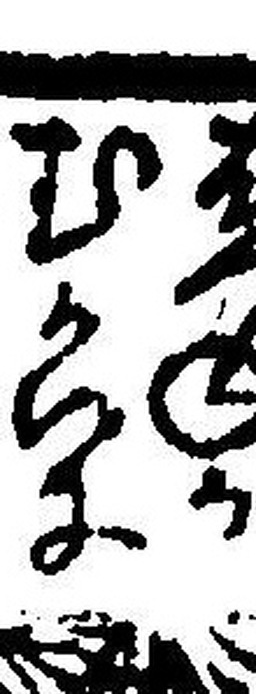むかいに
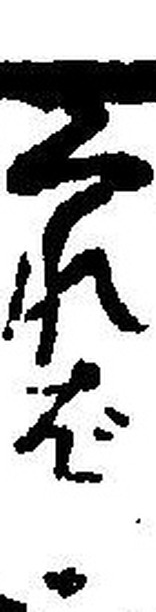くれば
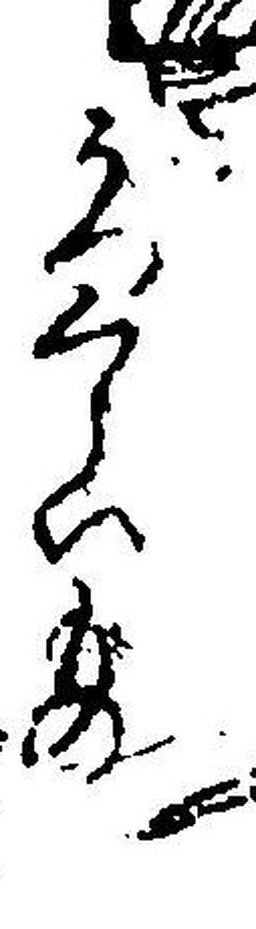うつくしいもの
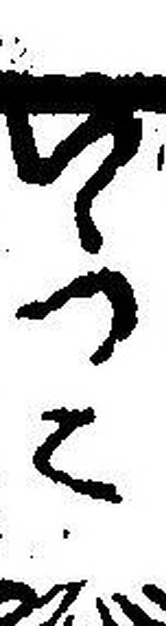いゝつこ
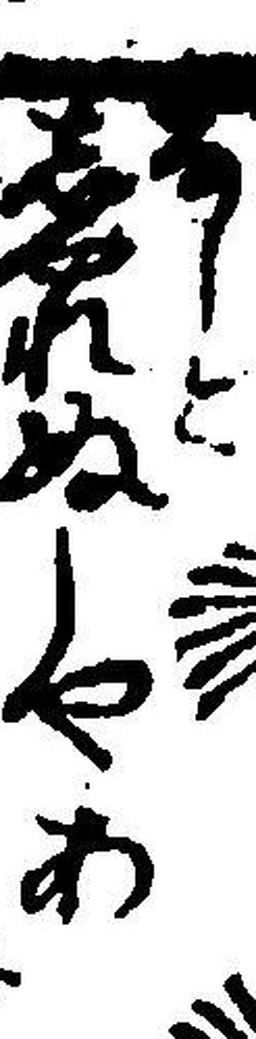しやれぬしやあ
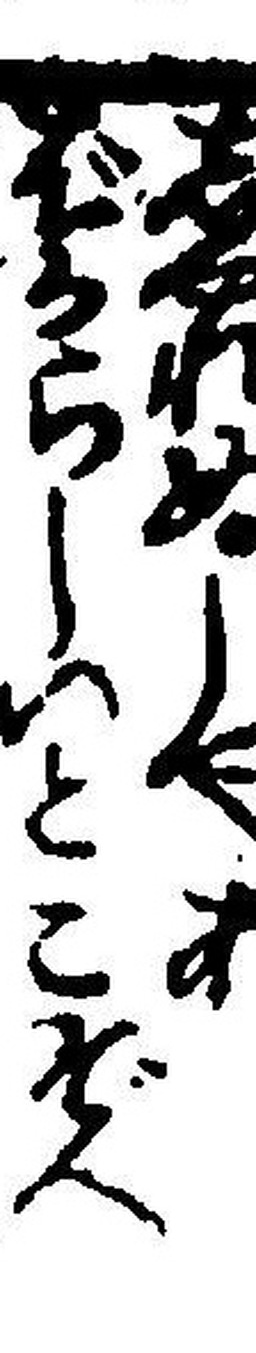ばからしいとこぞへ
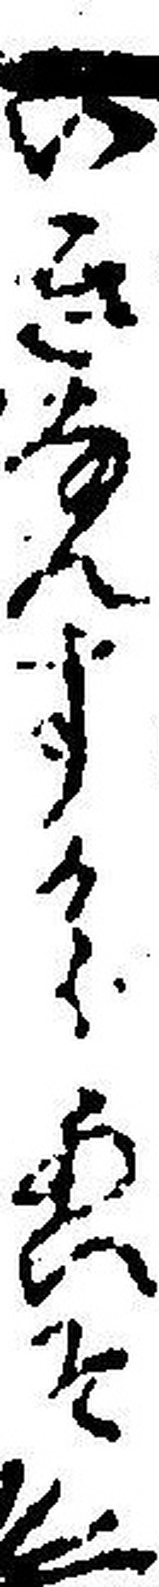いきなんすかあいそ
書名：間違狐之女郎買 / 市場通笑作
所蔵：東京大学総合図書館 General Library in the University of Tokyo, JAPAN
